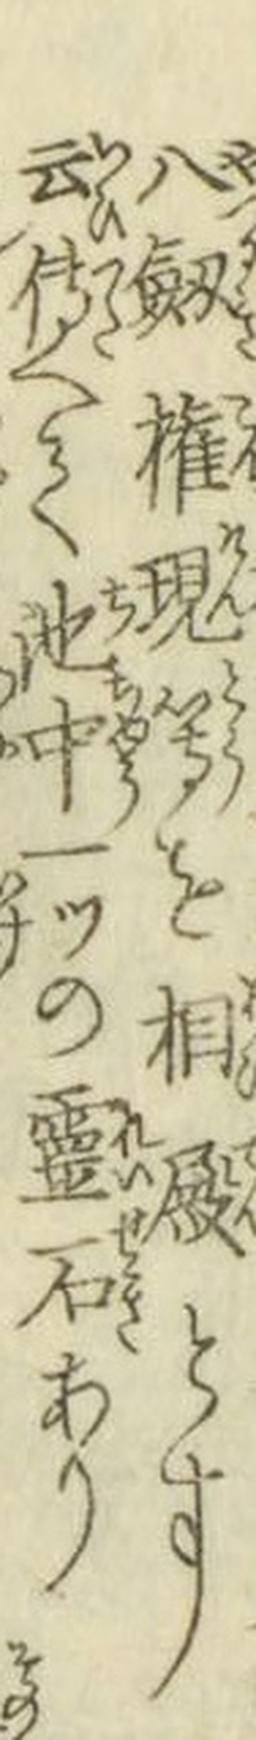云傳へて池中一ッの霊石あり
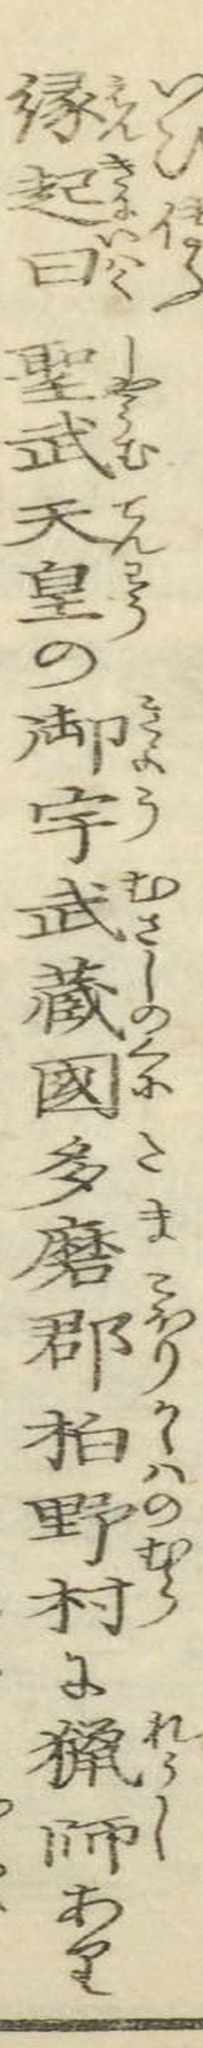縁起曰聖武天皇の御宇武蔵国多磨郡柏野村に猟師あり
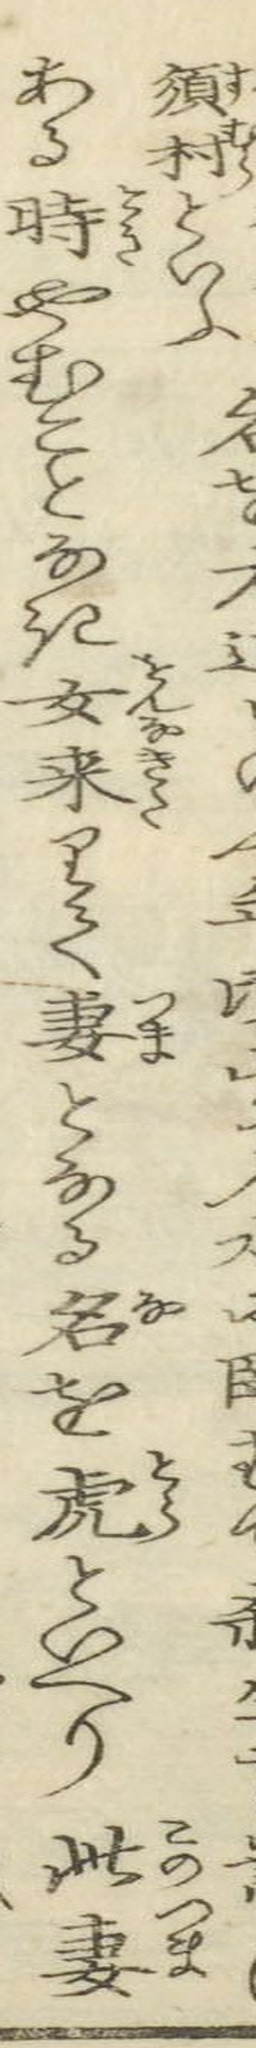ある時やむことなき女来りて妻となる名を虎といへり此妻
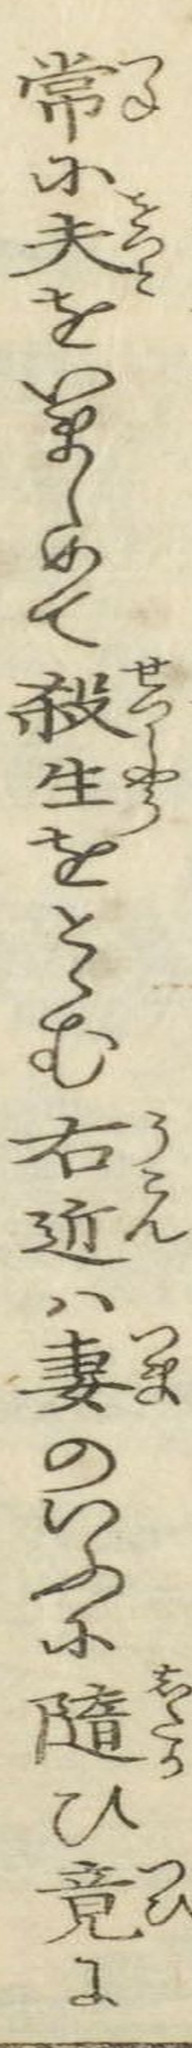常に夫をいましめて殺生をとゝむ右近は妻のいふに随ひ竟に
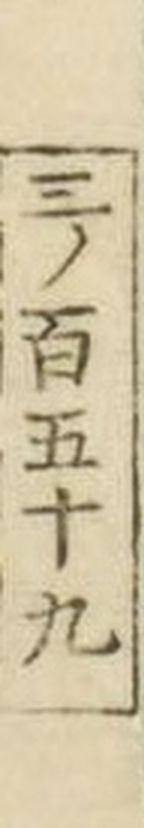三ノ百五十九
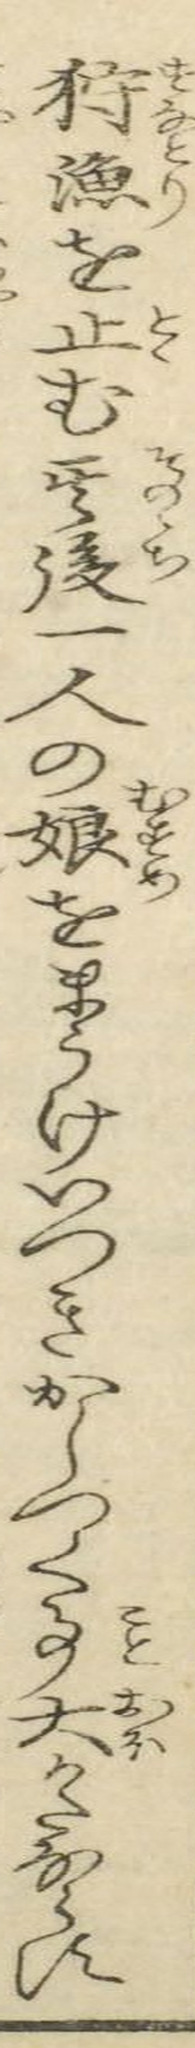狩漁を止む其後一人の娘をまうけいつきかしつく事大かたならす
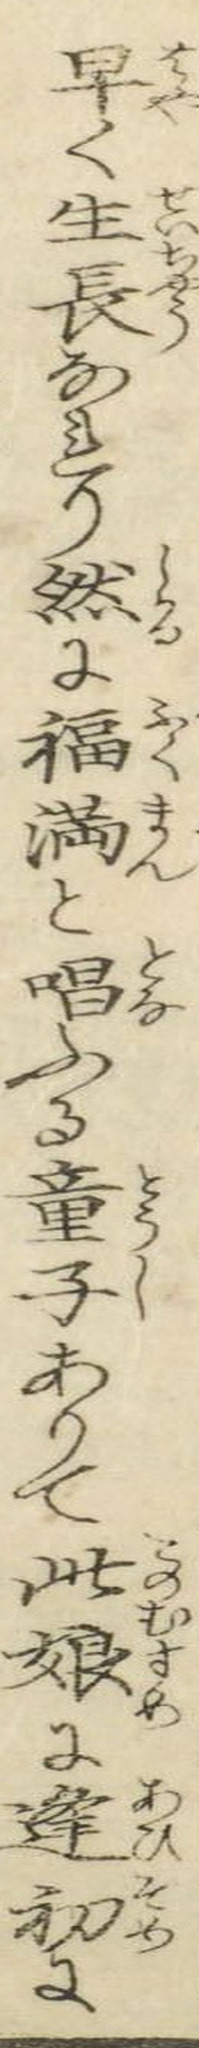早く生長なれり然に福満と唱ふる童子ありて此娘に逢初に
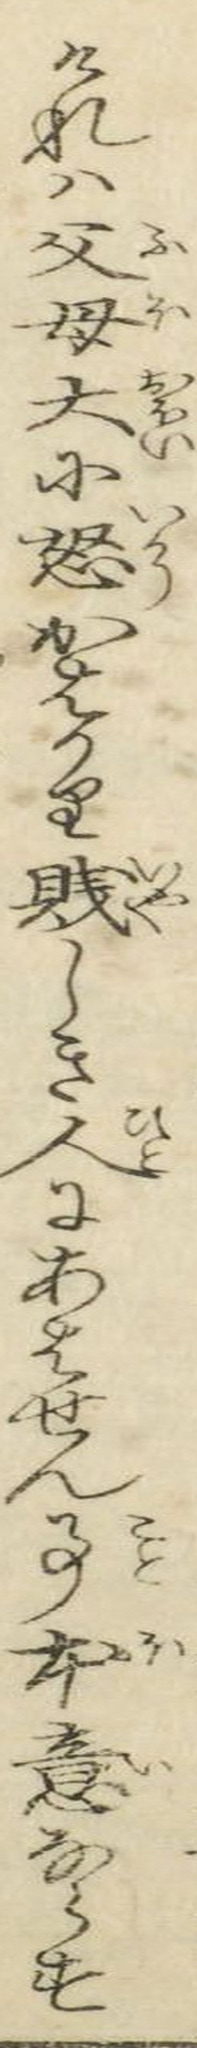けれは父母大に怒かはりり賤しき人にあはせん事本意ならす
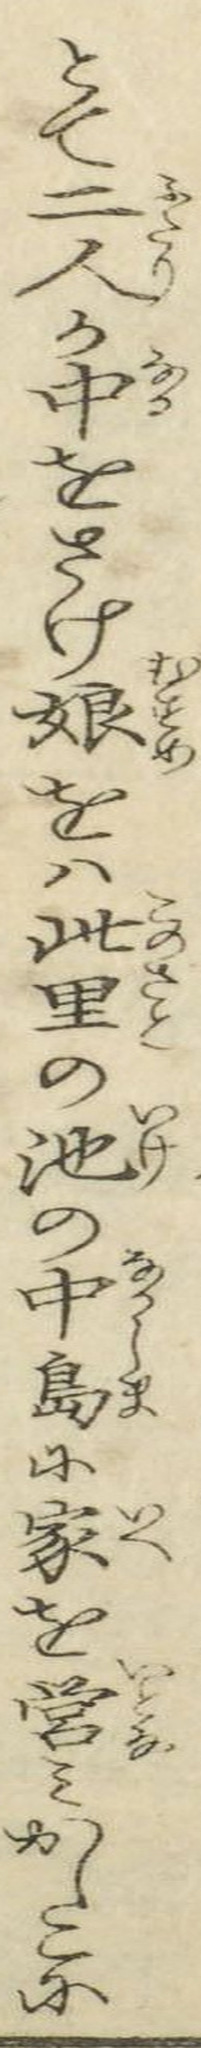とて二人の中をさけ娘をは此里の池の中島に家を営みかしこに
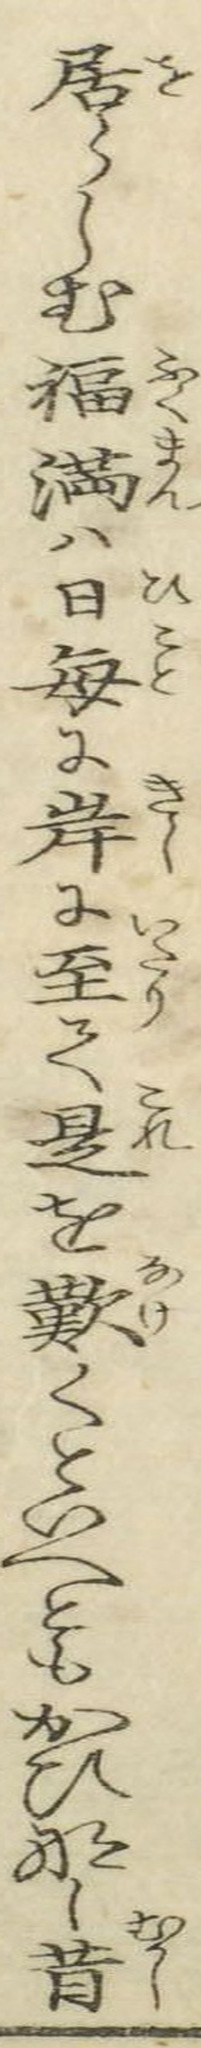居らしむ福満は日毎に岸に至て是を歎くといへともかひなし昔
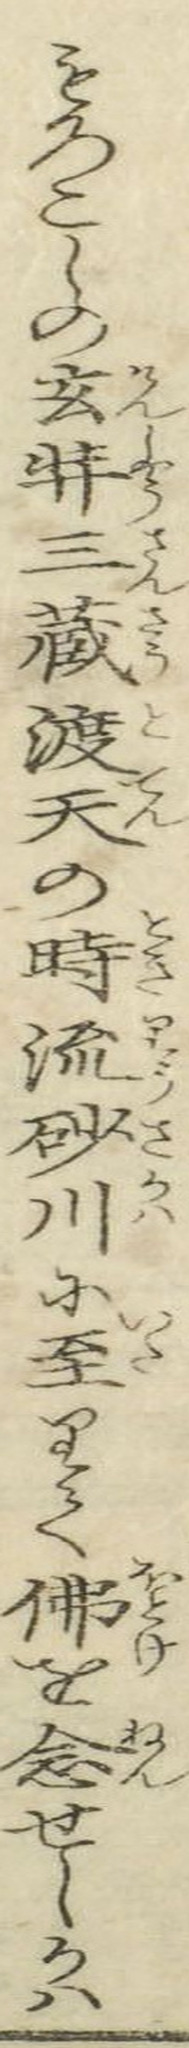もろこしの玄奘三蔵渡天の時流砂川に至りて仏を念せしかは
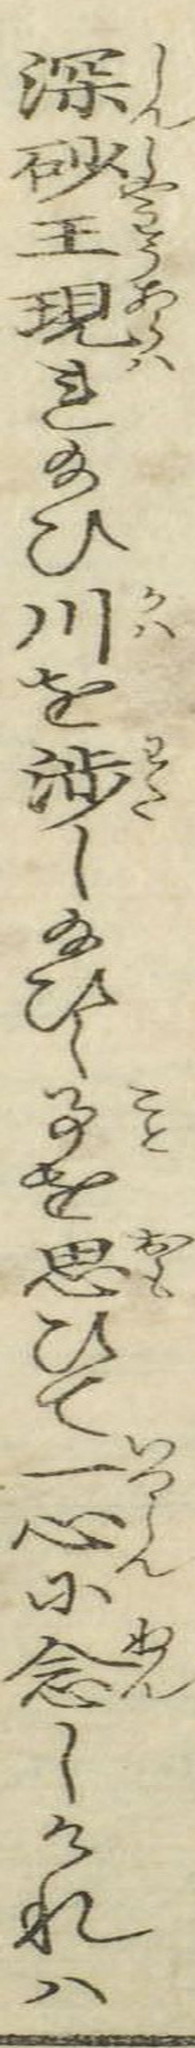深砂王現れ給ひ川を渉し給ひし事を思ひて一心に念しけれは
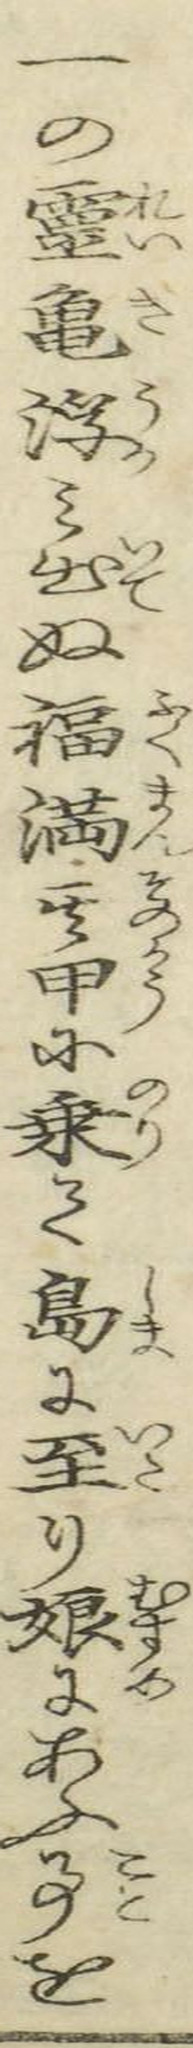一の霊亀浮み出ぬ福満其甲に乗て島に至り娘にあふ事を
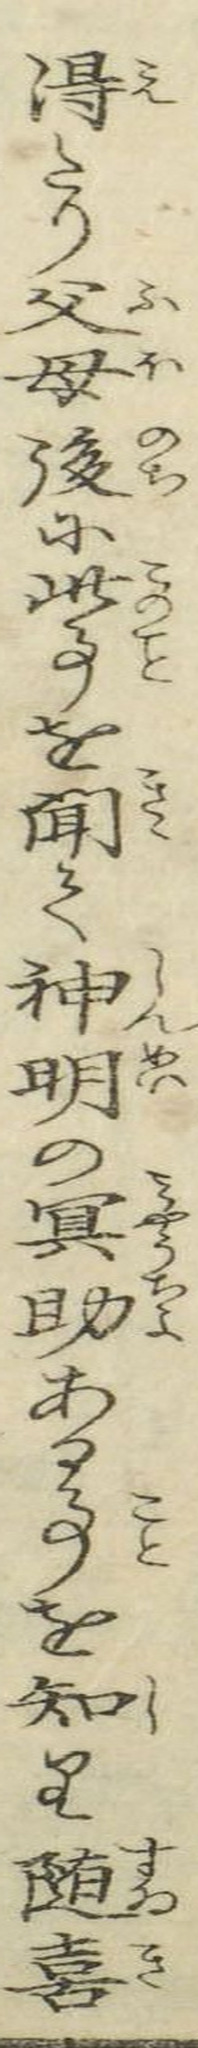得たり父母後に此事を聞て神明の冥助ある事を知り随喜
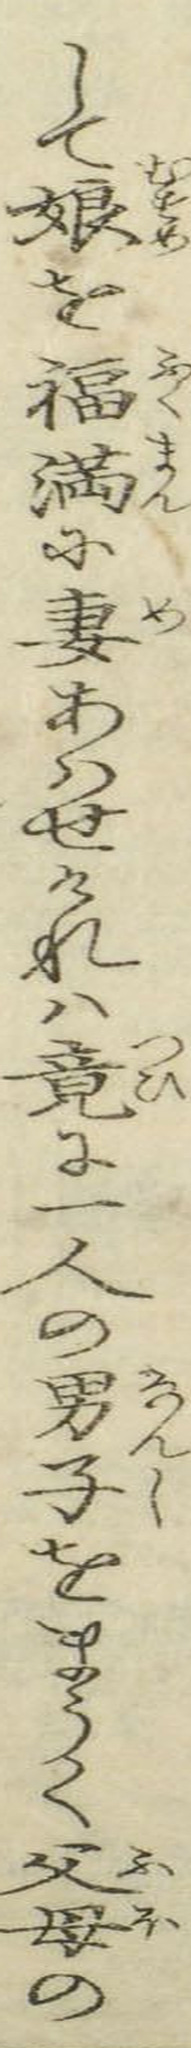して娘を福満に妻あはせけれは竟に一人の男子をまうく父母の
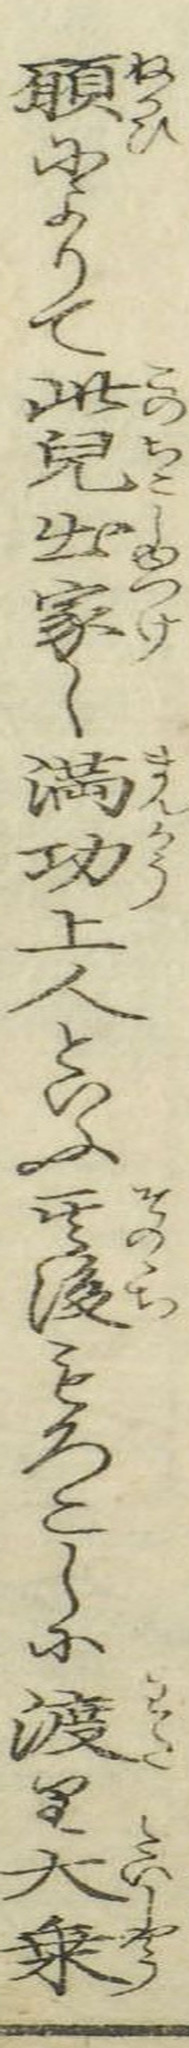願によりて此児出家し満功上人といふ其後もろこしに渡り大乗
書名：江戸名所図会 20巻 巻之9
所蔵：東京学芸大学教育コンテンツアーカイブ
